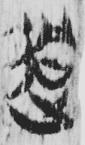迵（通）
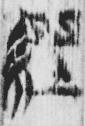經（涇）
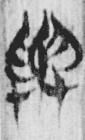與
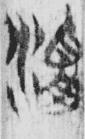渭
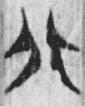北
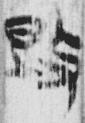○（注）
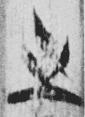之
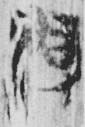河
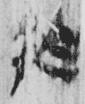於
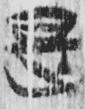是
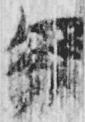{虍介}（乎）
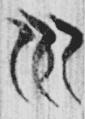州
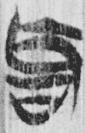○（始）
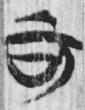可
